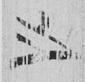之
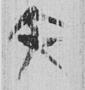内
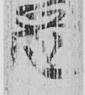是
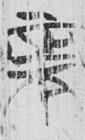帝
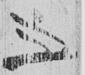之
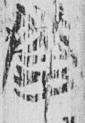○（關）
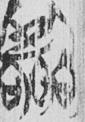臨
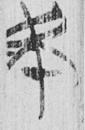民
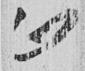㠯（以）
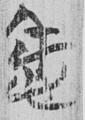○（仁）
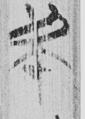民
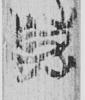莫
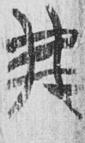弗
